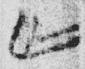亡（无）
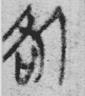咎
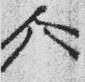六
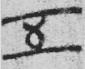五
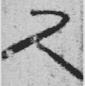氒（厥）
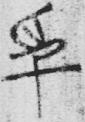孚
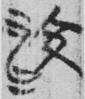洨（交）
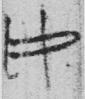女（如）
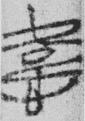○（威）
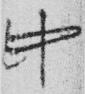女（如）
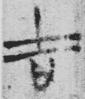吉
